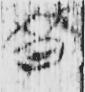冬（冬）
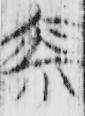○（夕）
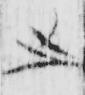之
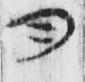月
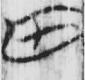甲
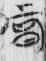晨
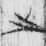之
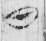日
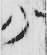少
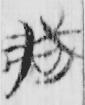戕
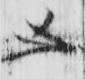之
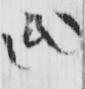州
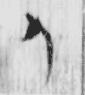人
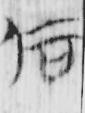冶
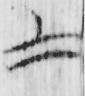士
